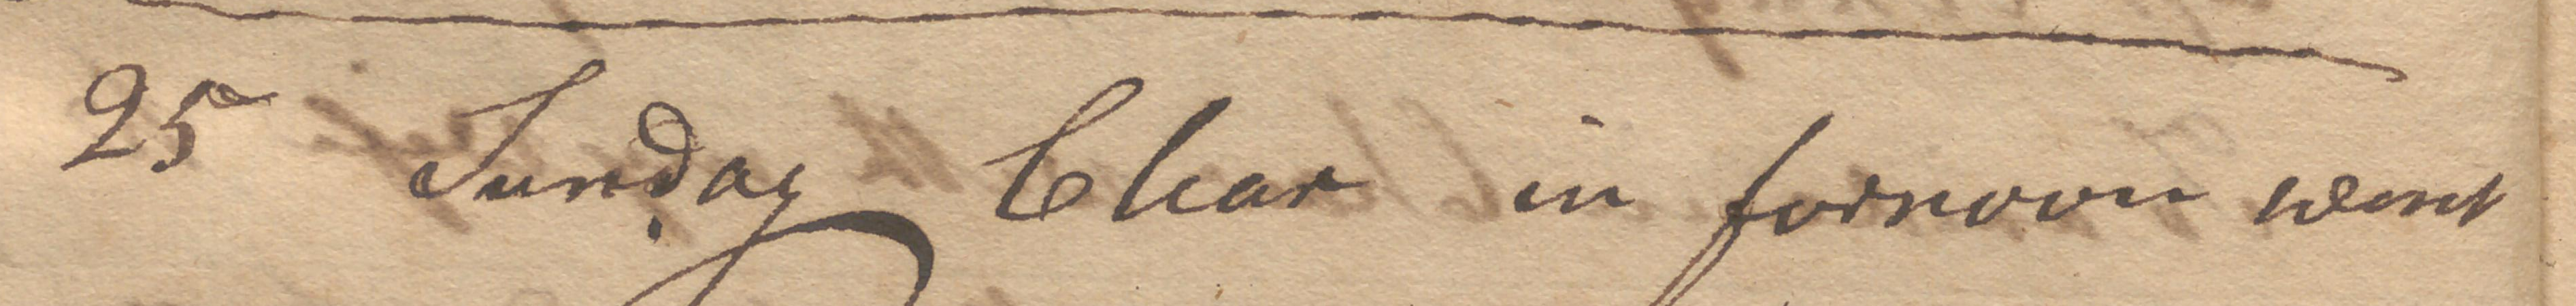25 Sunday- Clear in fornoon went
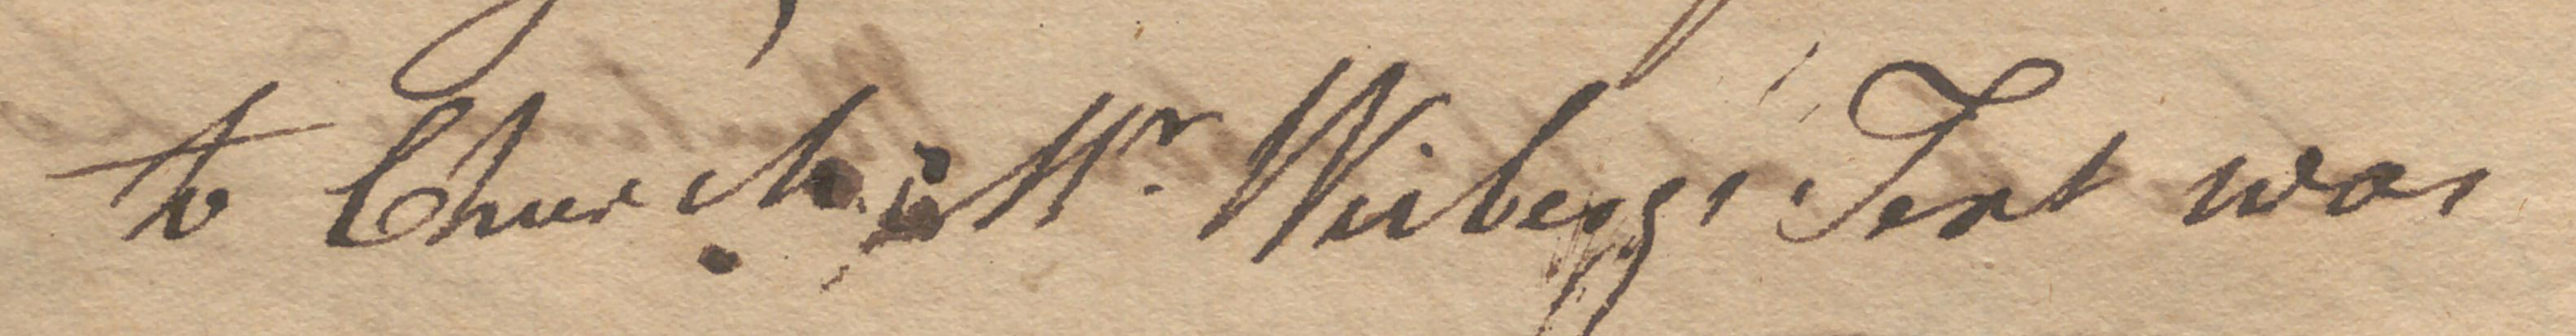to Church M^r Wubergs Text was
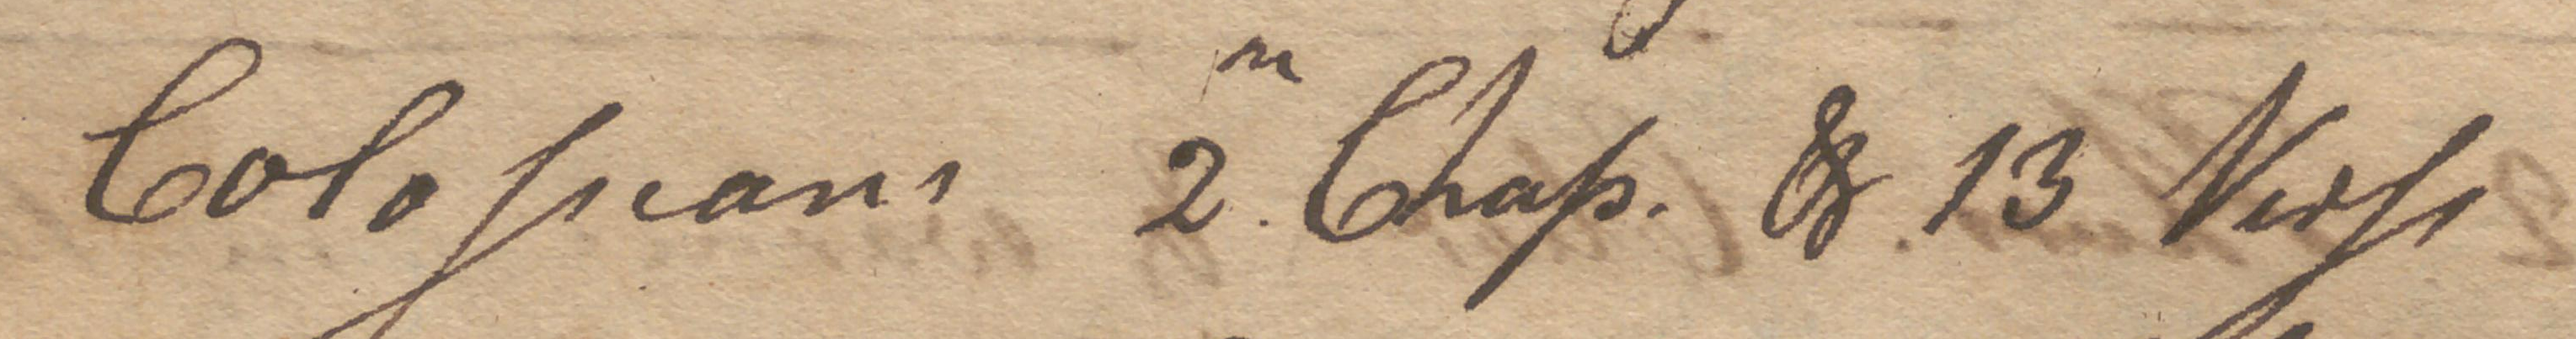Colossians 2^th. Chap. & 13 Verss
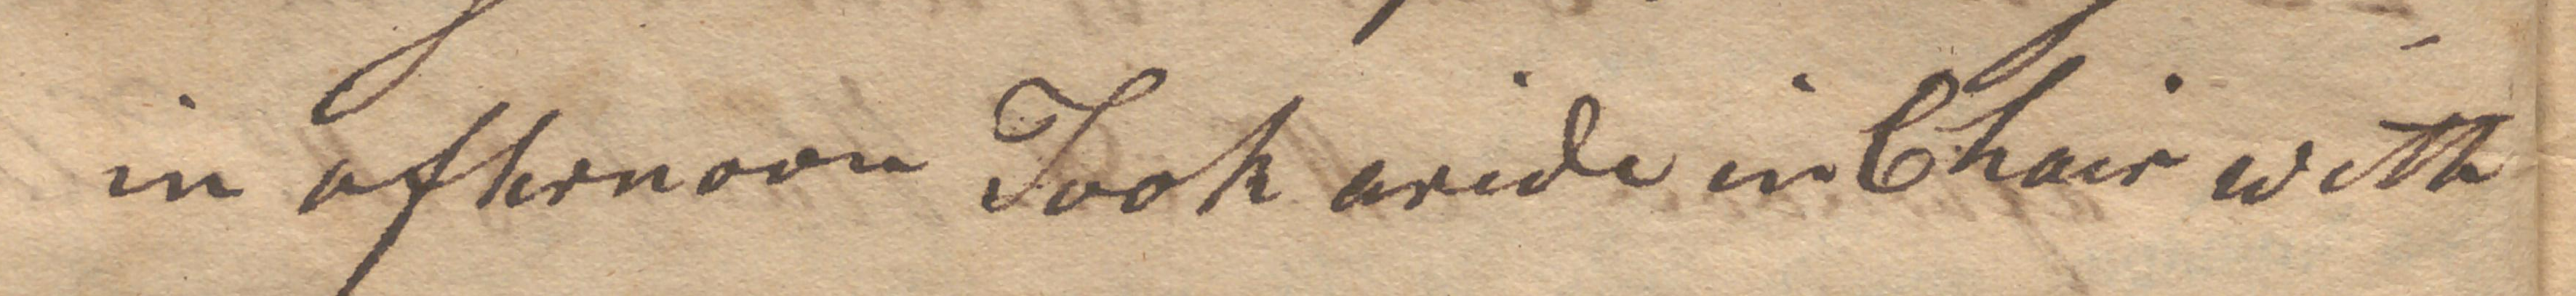in afternoon Took a ride in Chair with
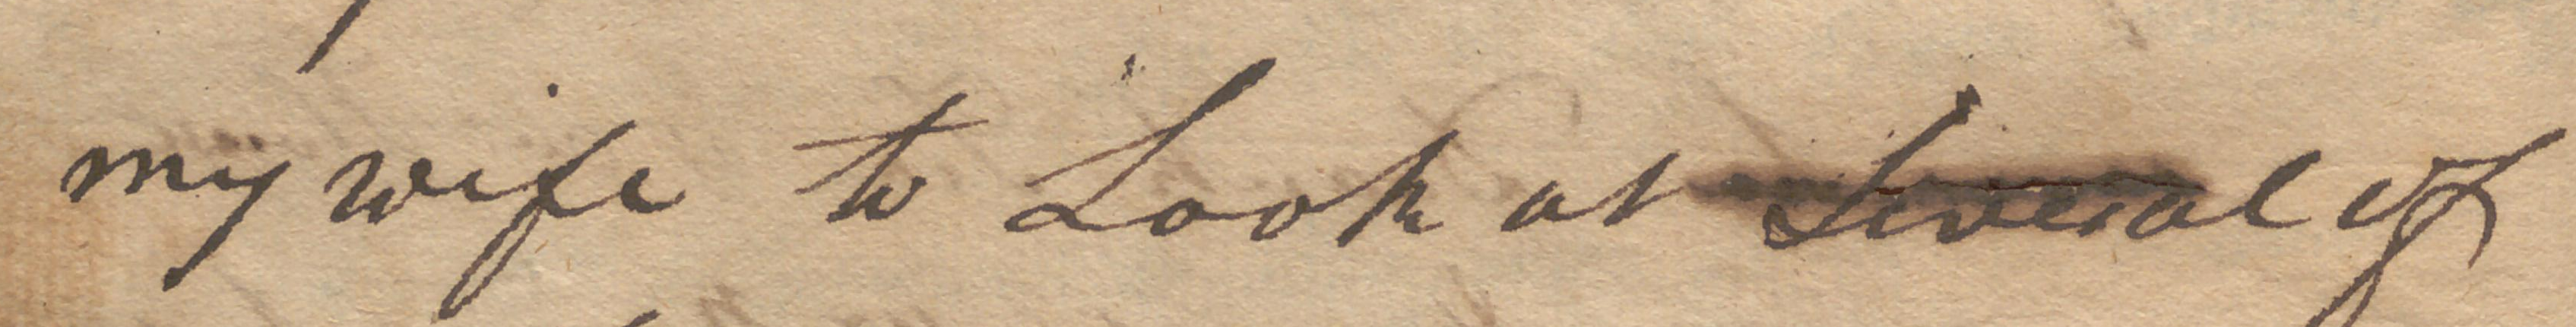my wife to Look at Several of
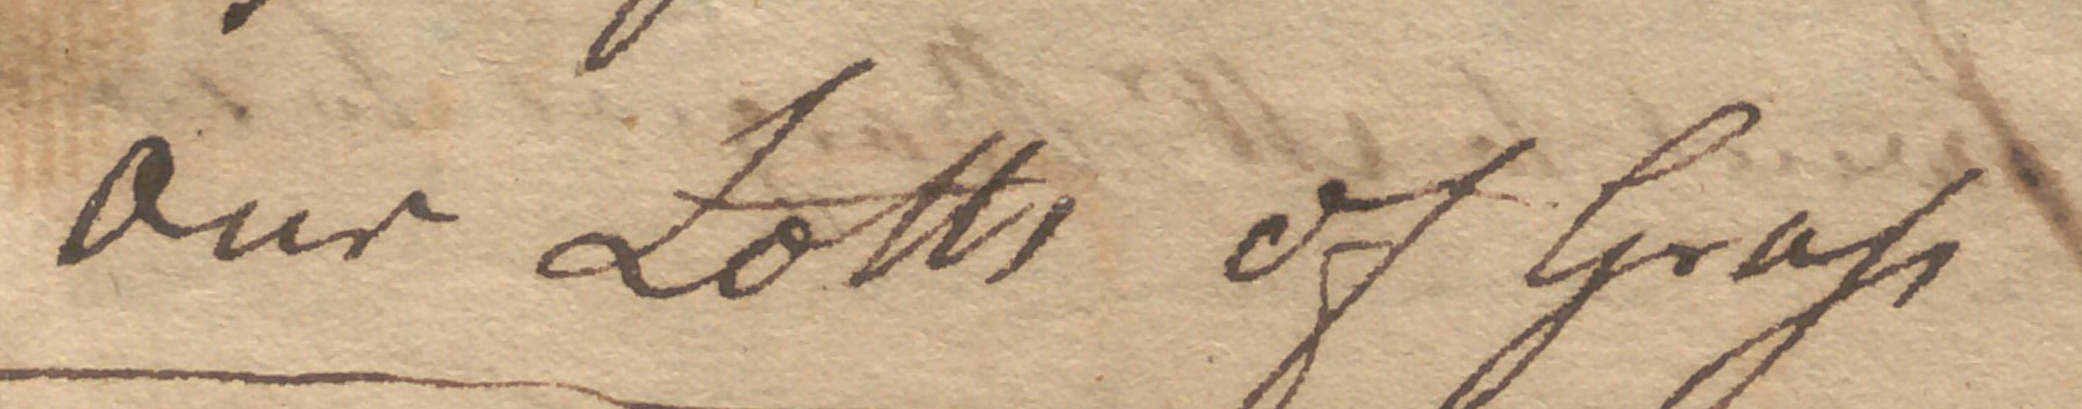our Lotts of Grass
